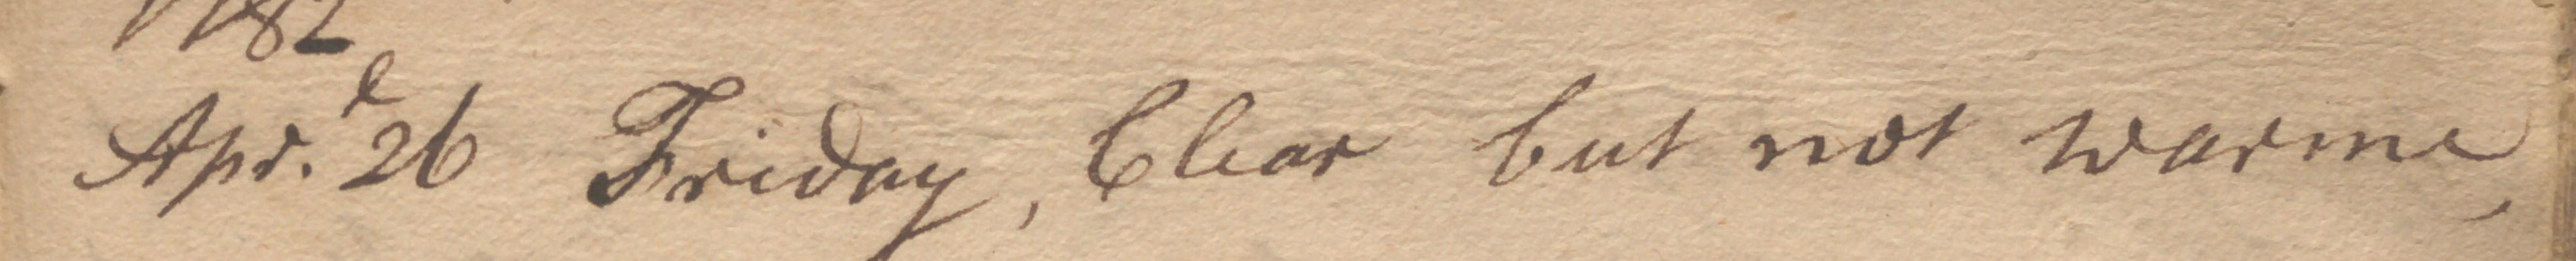Apr^l. 26 Friday Clear but not warme
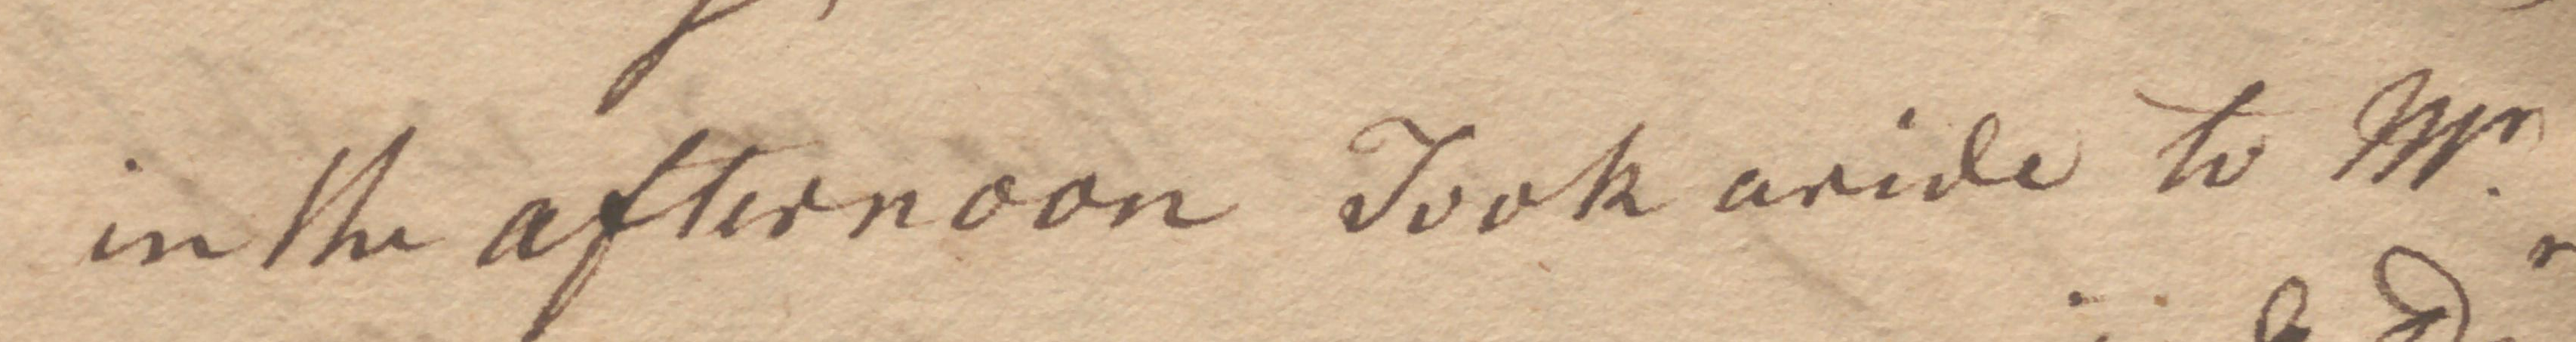in the afternoon Took a ride to M^r.
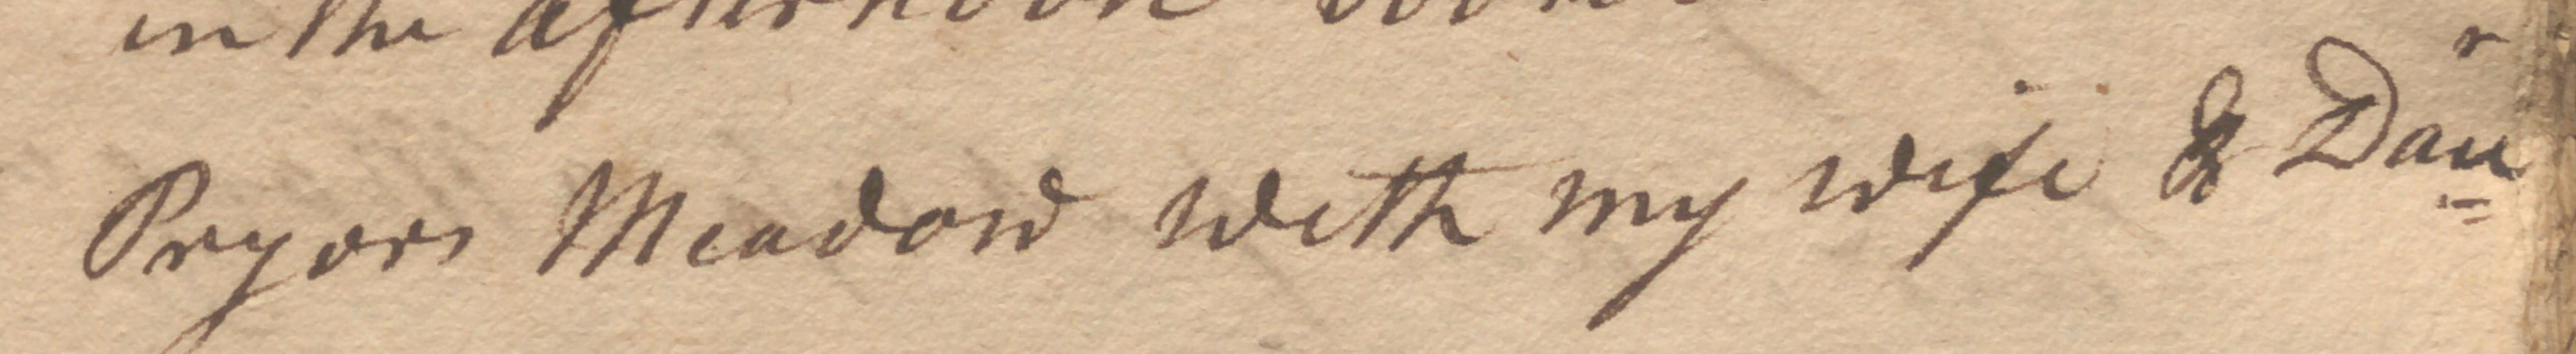Pryors Meadow with my wife & Dau^r
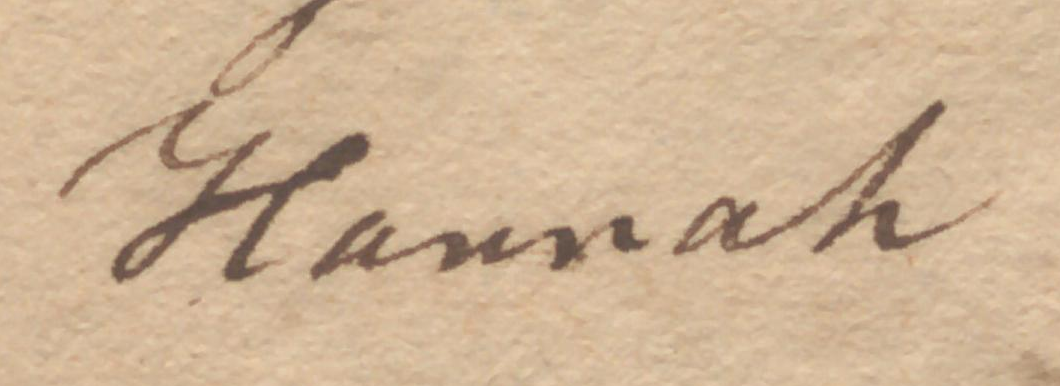Hannah
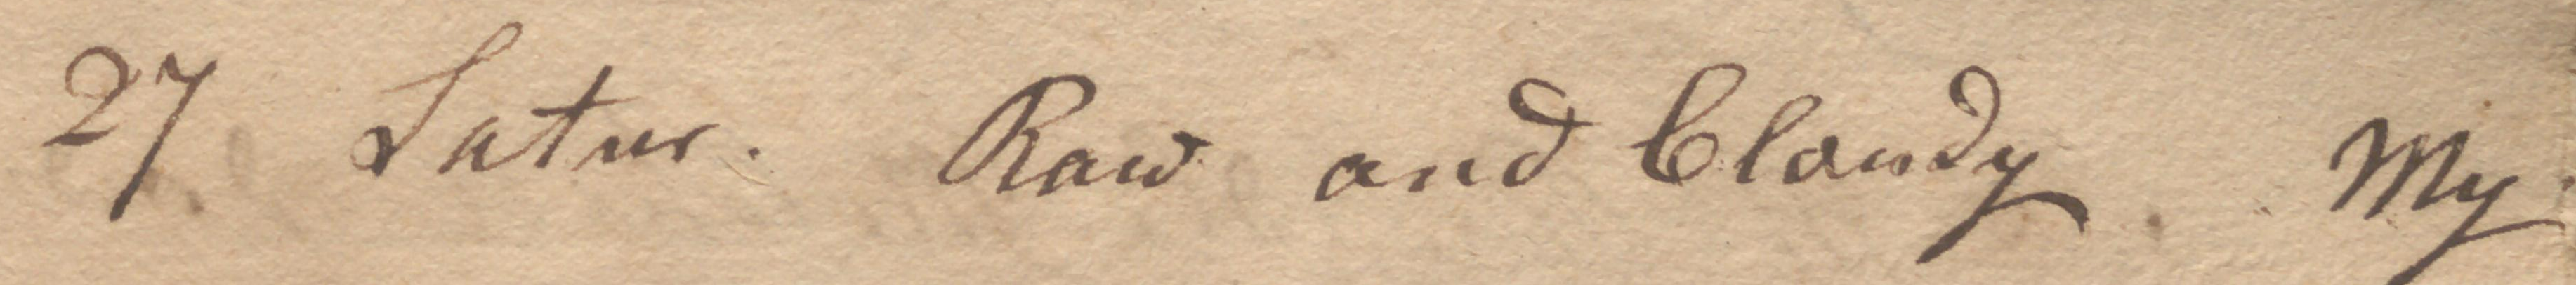27 Satur. Raw and Cloudy My
